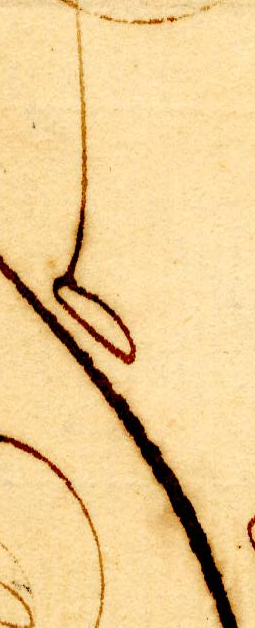To
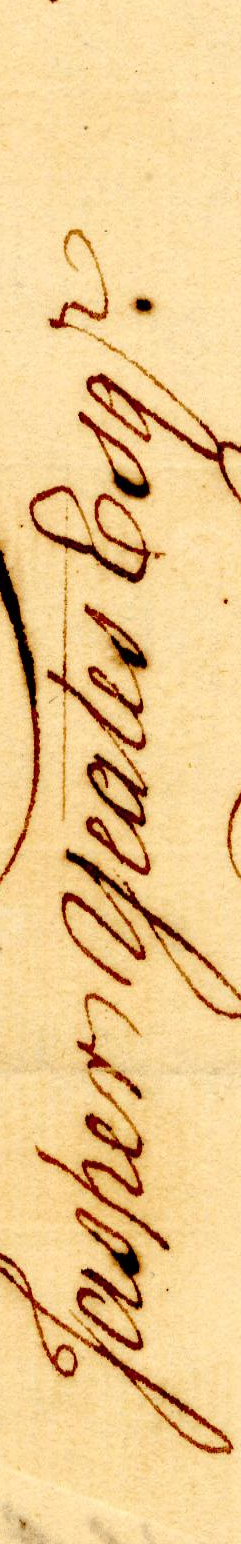Jasper Yeates Esq^r
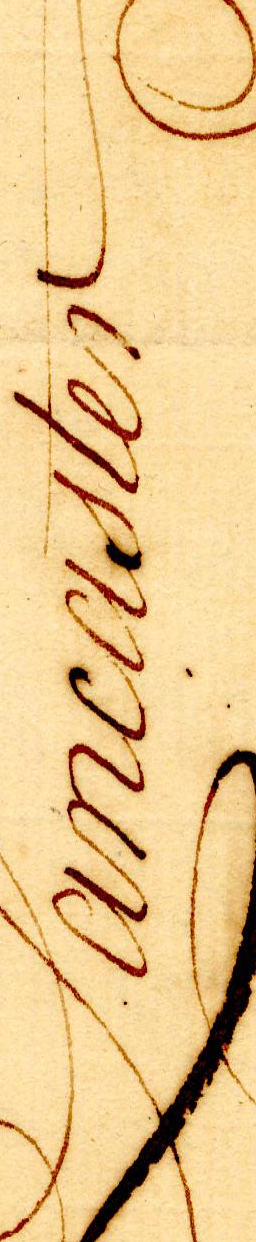Lancaster
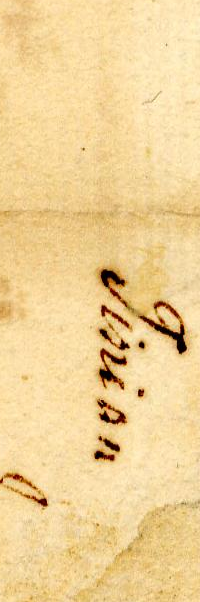Tinian
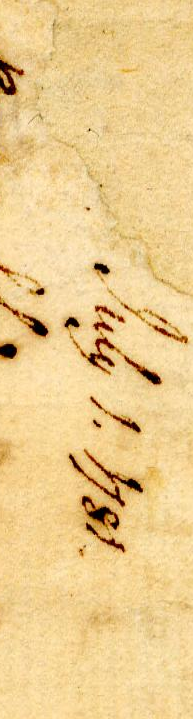July 1 1781
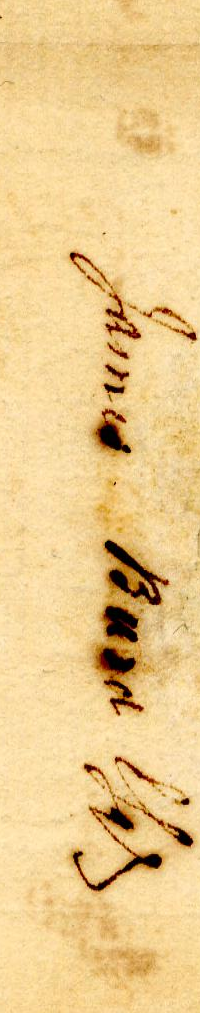James Burd Esq^r
